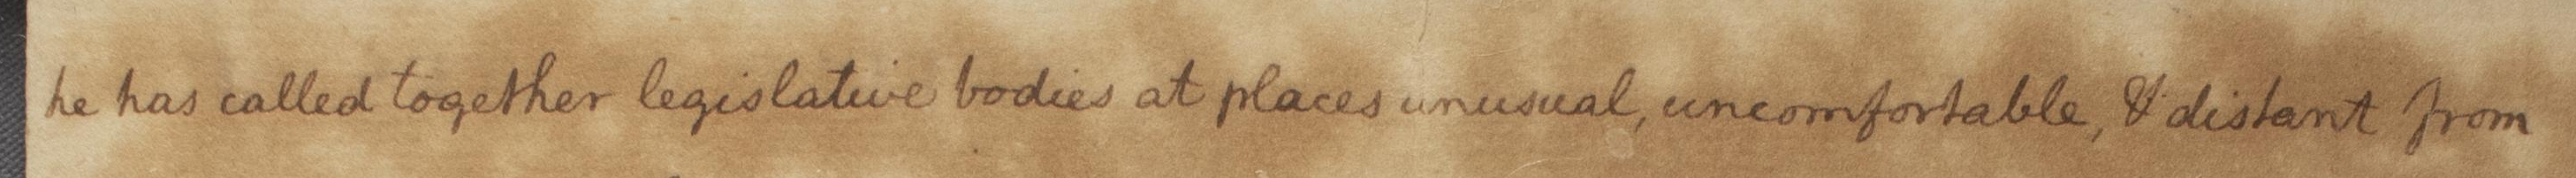he has called together legislative bodies at places unusual, uncomfortable, & distant from
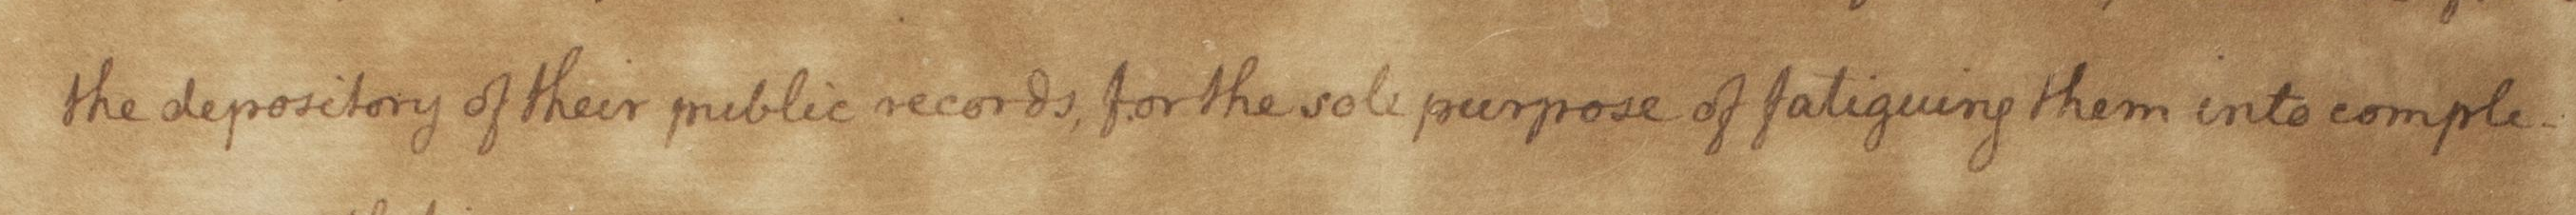the depository of their public records, for the sole purpose of fatiguing them into compli-
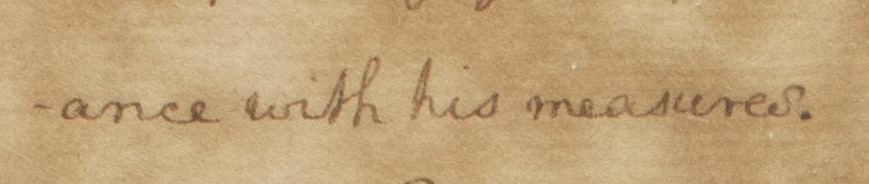-ance with his measures.
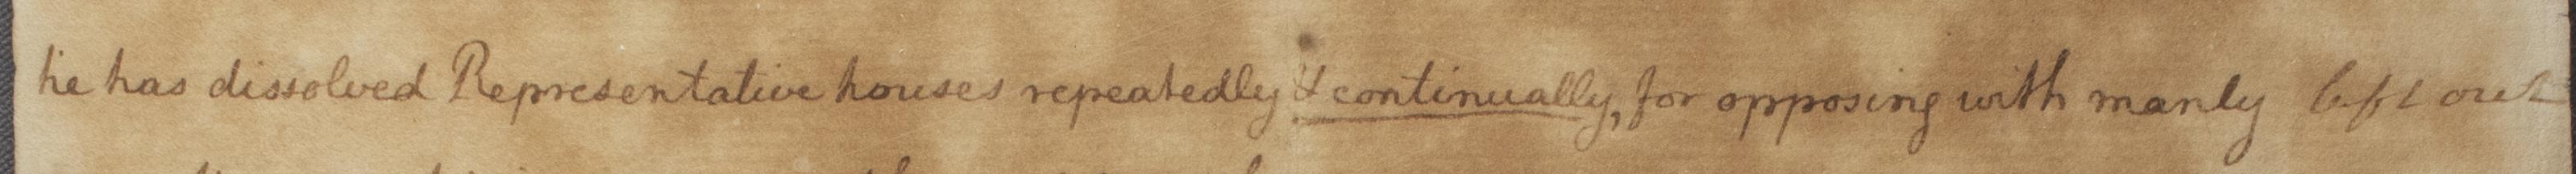he has dissolved Representative houses repeatedly & continually, for opposing with manly left out
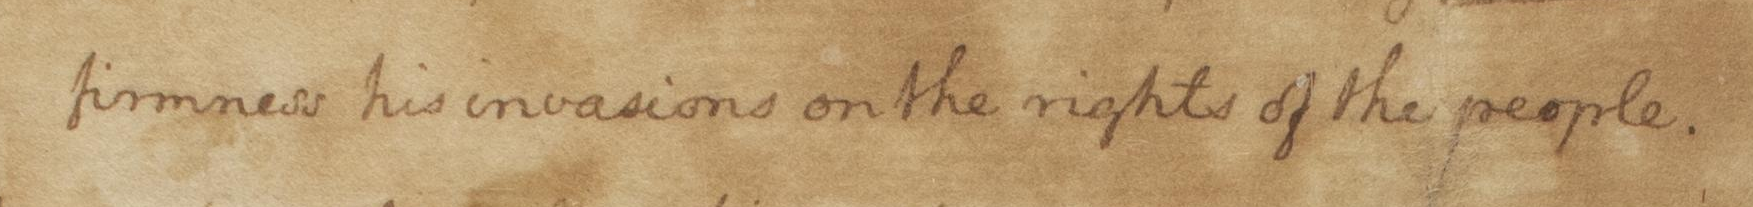firmness his invasions on the rights of the people.
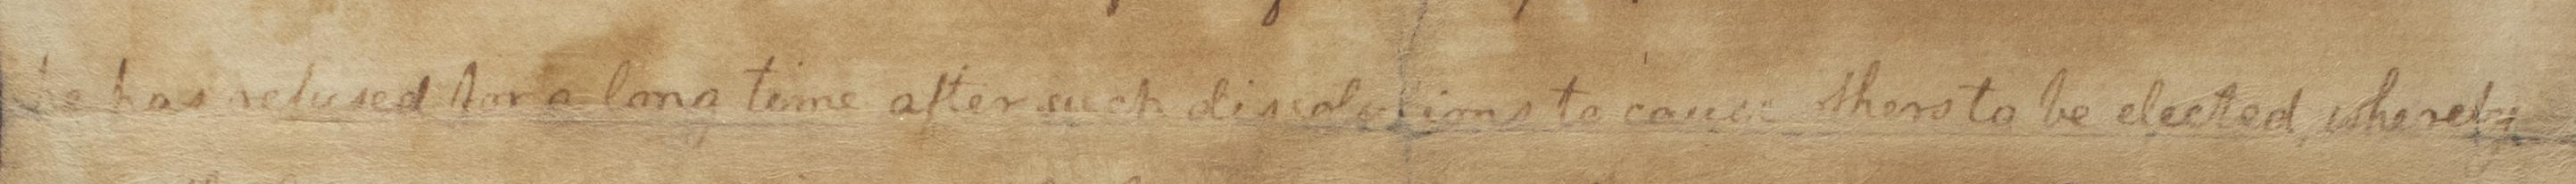he has as refused for a long time after such dissolutions to cause others to be elected whereby
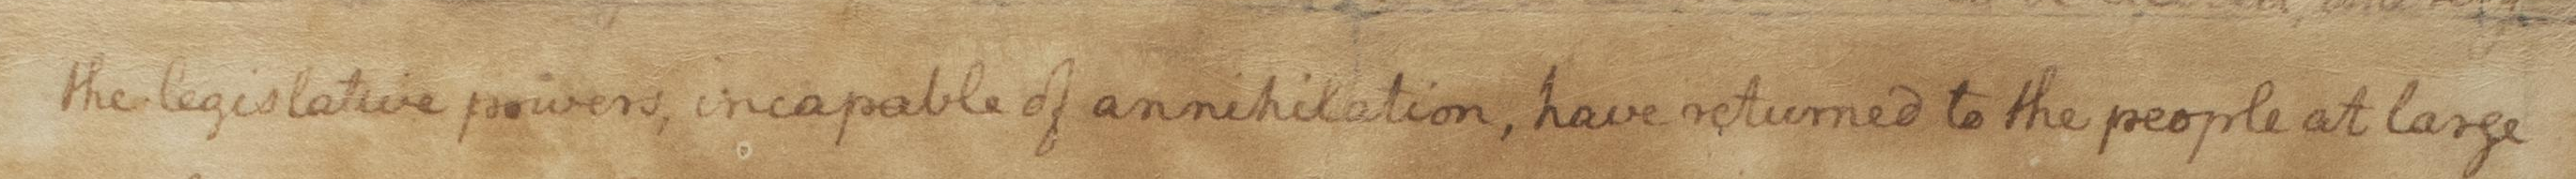the Legislative powers, incapable of Annihilation, have returned to the people at large
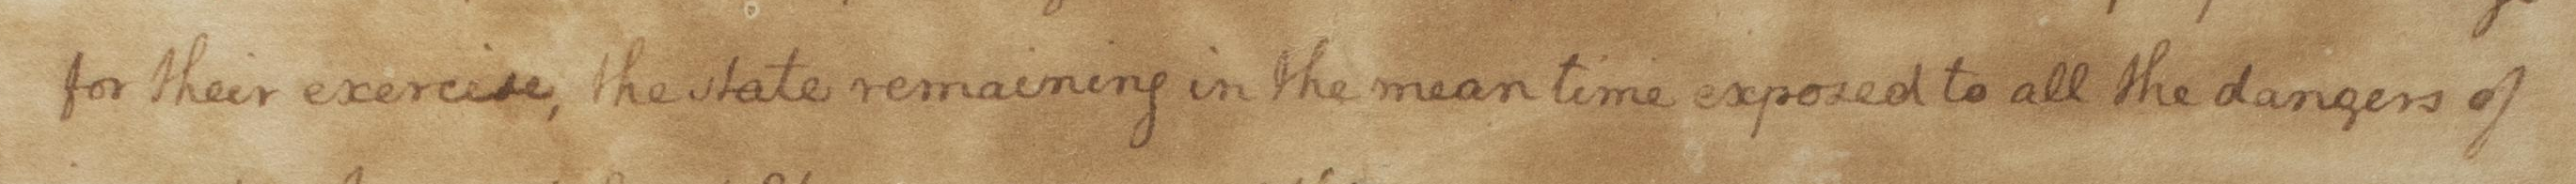for their exercise, the state remaining in the meantime exposed to all the dangers of
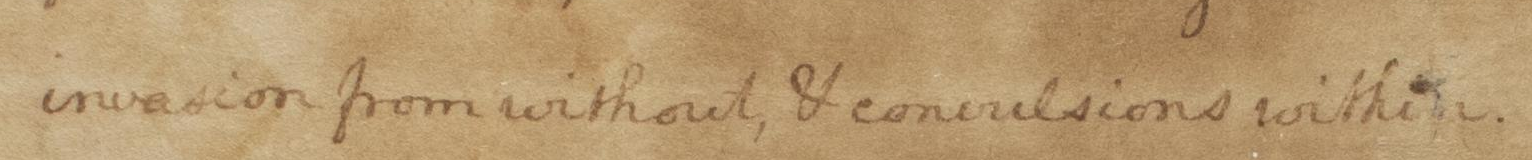invasion from without, & conculsions within
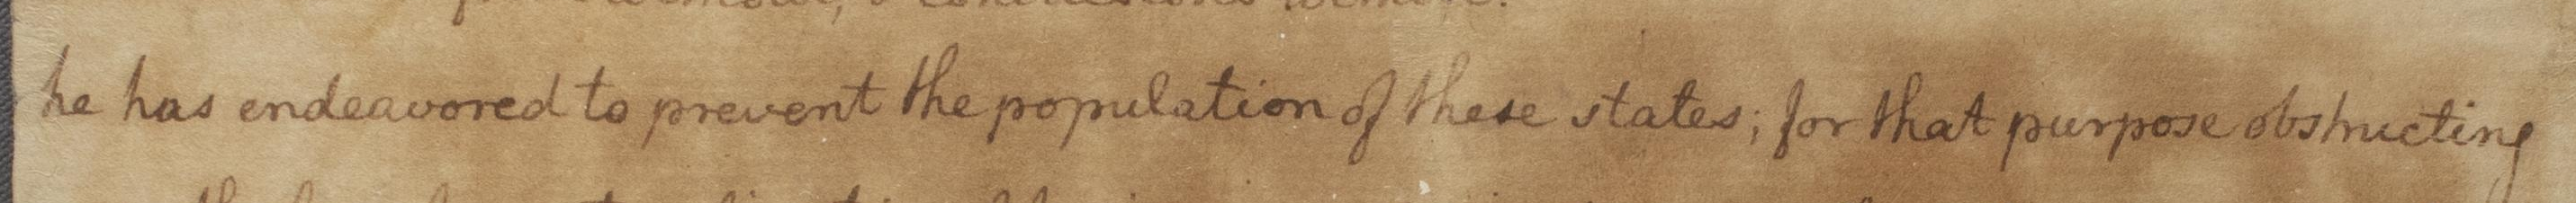he has endeavored to prevent the population of these states, for that purpose obstructing
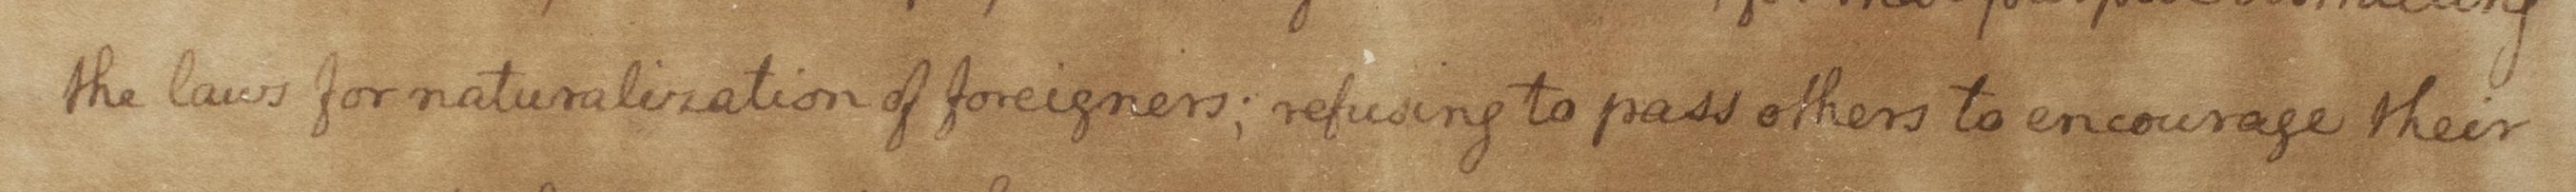the laws for naturalization of foreigners; refusing to pass others to encourage their
